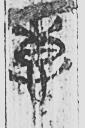惠
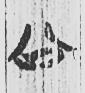公
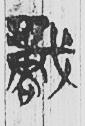戰
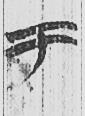于
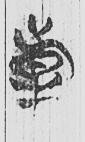倝
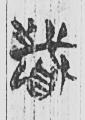{止頁戈}
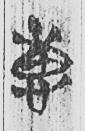惠
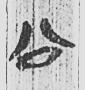公
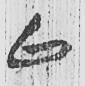㠯（以）
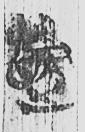歸
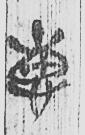惠
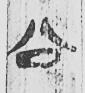公
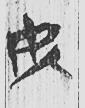𡚦
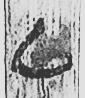㠯（以）
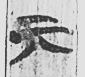亓
